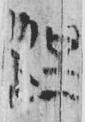浧（盈）
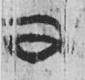日
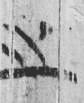之
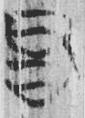○（始）
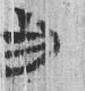出
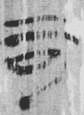可（何）
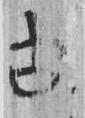古（故）
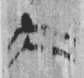大
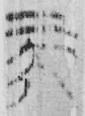而
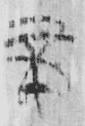不
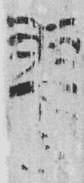○（炎）
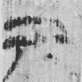亓（其）
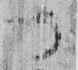人
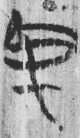○（中）
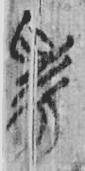奚（奚）
